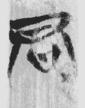君
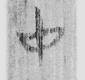中
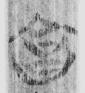合
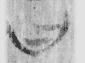曰
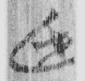臣
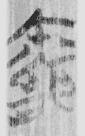{尒䎽}
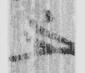之
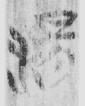湯
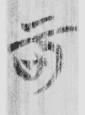可
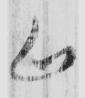㠯（以）
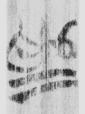爲
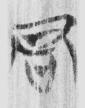君
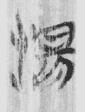湯
